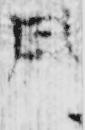丹
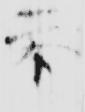而
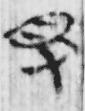𠭁（陳）
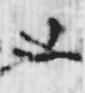之
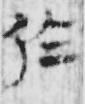於
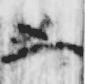之
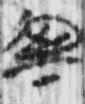室
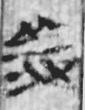義
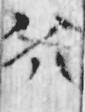癸
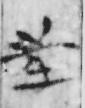往
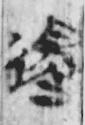還
